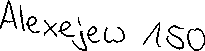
Alexejew 150
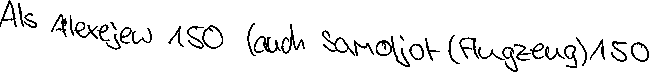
Als Alexejew 150 (auch Samoljot (Flugzeug) 150
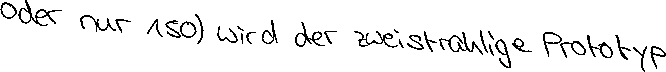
oder nur 150) wird der zweistrahlige Prototyp
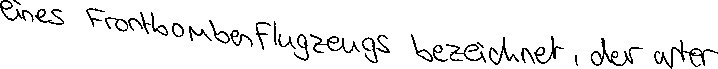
eines Frontbombenflugzeugs bezeichnet, der unter
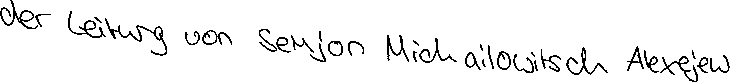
der Leitung von Semjon Michailowitsch Alexejew
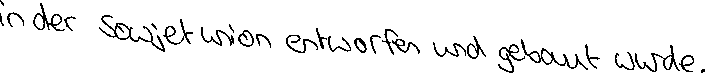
in der Sowjetunion entworfen und gebaut wurde.
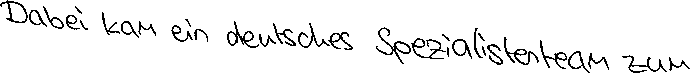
Dabei kam ein deutsches Spezialistenteam zum
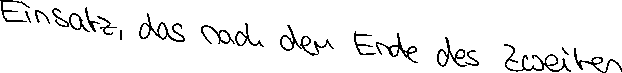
Einsatz, das nach dem Ende des Zweiten
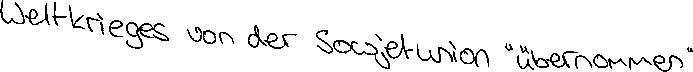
Weltkrieges von der Sowjetunion "übernommen"
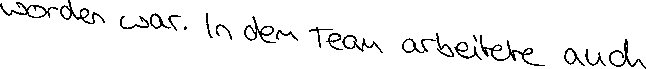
worden war. In dem Team arbeitete auch
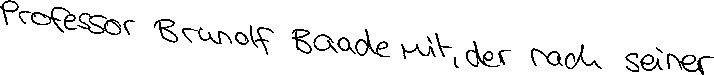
Professor Brunolf Baade mit, der nach seiner
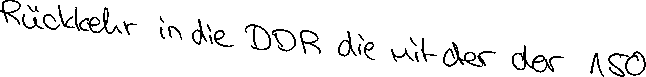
Rückkehr in die DDR die mit der 150
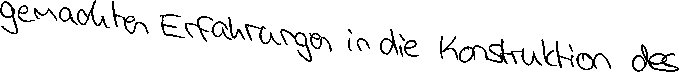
gemachten Erfahrungen in die Konstruktion des
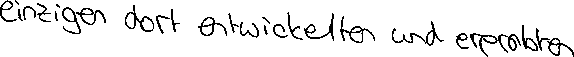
einzigen dort entwickelten und erprobten
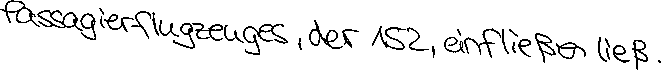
Passagierflugzeuges, der 152, einfließen ließ.
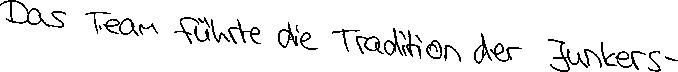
Das Team führte die Tradition der Junkers-
